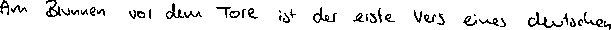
Am Brunnen vor dem Tore ist der erste Vers eines deutschen
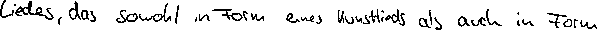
Liedes, das sowohl in Form eines Kunstlieds als auch in Form
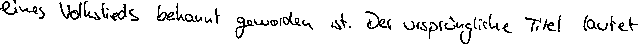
eines Volkslieds bekannt geworden ist. Der ursprüngliche Titel lautet
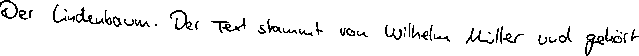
Der Lindenbaum. Der Text stammt von Wilhelm Müller und gehört
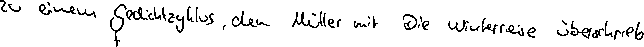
zu einem Gedichtzyklus, den Müller mit Die Winterreise überschrieb
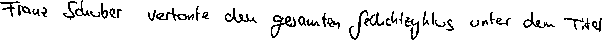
Franz Schubert vertonte den gesamten Gedichtzyklus unter dem Titel
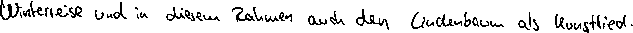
Winterreise und in diesem Rahmen auch den Lindenbaum als Kunstlied.
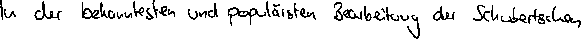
In der bekanntesten und populärsten Bearbeitung der Schubertschen
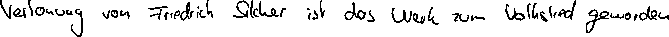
Vertonung von Friedrich Silcher ist das Werk zum Volkslied geworden
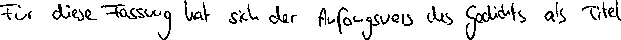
Für diese Fassung hat sich der Anfangsvers des Gedichts als Titel
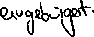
eingebürgert.
